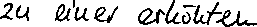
zu einer erhöhten
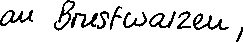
an Brustwarzen,
